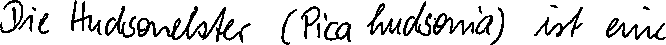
Die Hudsonelster (Pica hudsonia) ist eine
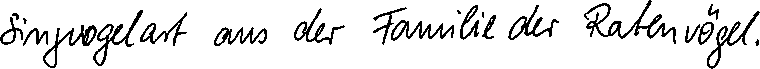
Singvogelart aus der Familie der Rabenvögel.
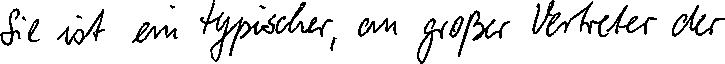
Sie ist ein typischer, cm großer Vertreter der
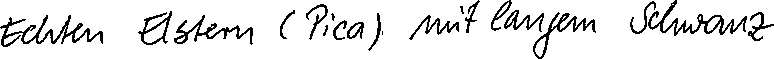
Echten Elstern (Pica) mit langem Schwanz
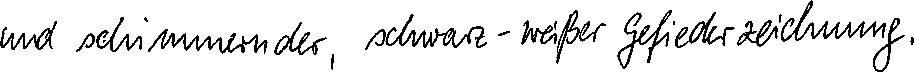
und schimmernder, schwarz-weißer Gefiederzeichnung.
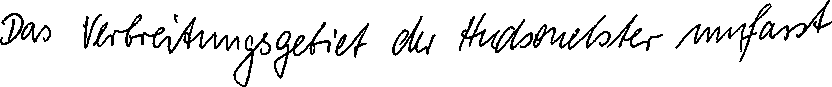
Das Verbreitungsgebiet der Hudsonelster umfasst
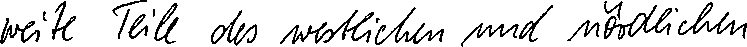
weite Teile des westlichen und nördlichen
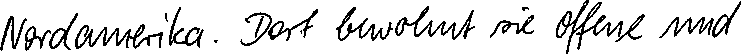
Nordamerika. Dort bewohnt sie offene und
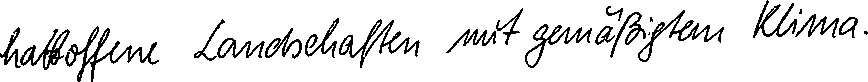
halboffene Landschaften mit gemäßigtem Klima.
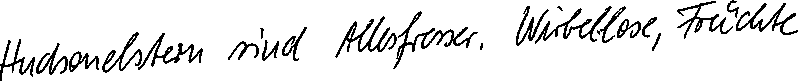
Hudsonelstern sind Allesfresser. Wirbellose, Früchte
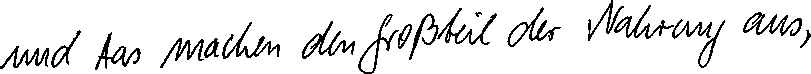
und Aas machen den Großteil der Nahrung aus,
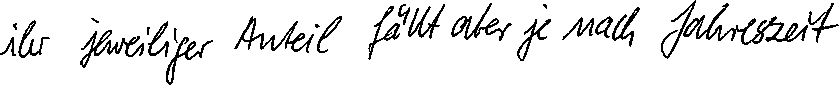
ihr jeweiliger Anteil fällt aber je nach Jahreszeit
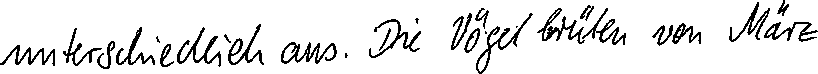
unterschiedlich aus. Die Vögel brüten von März
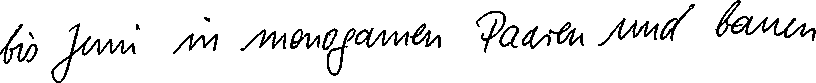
bis Juni in monogamen Paaren und bauen
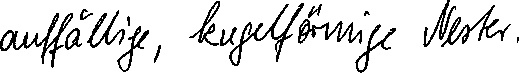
auffällige, kugelförmige Nester.
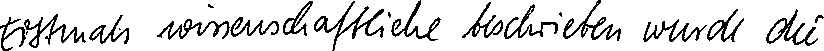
Erstmals wissenschaftlich beschrieben wurde die
